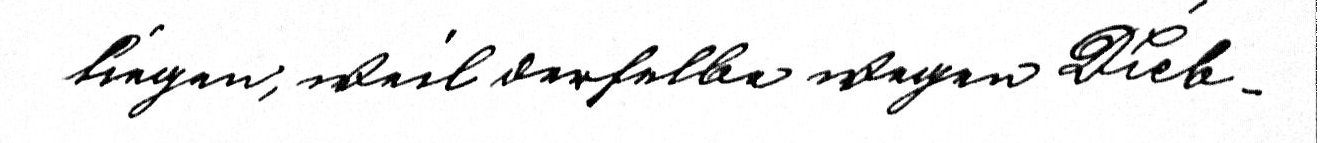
liegen, weil derselbe wegen Dieb¬
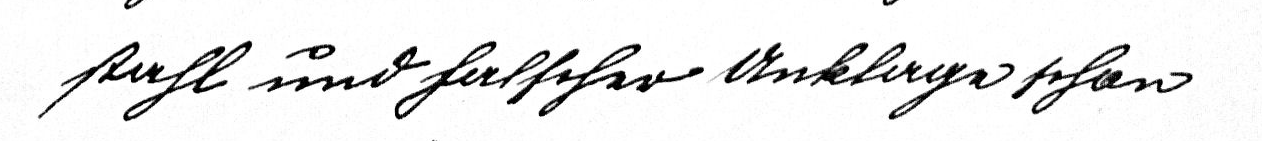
stahl und falscher Anklage schon
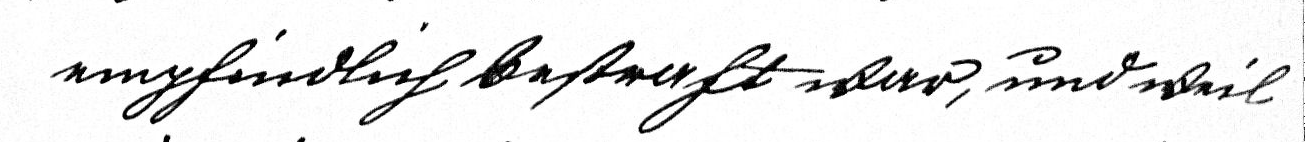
empfindlich bestraft war, und weil
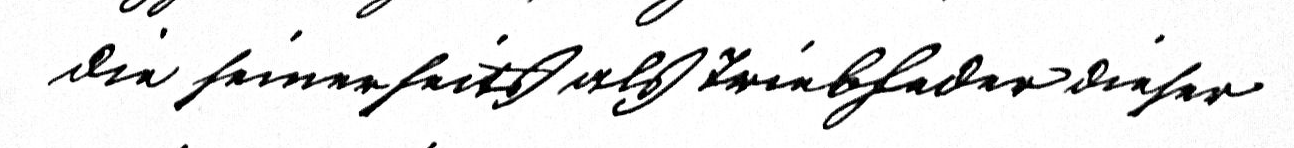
die seinerseits als Triebfader dieser
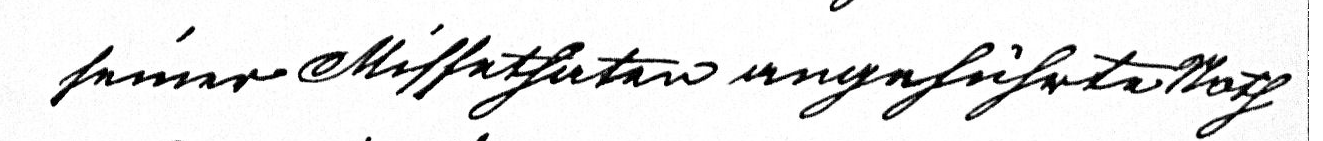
seiner Missethaten angeführte Noth
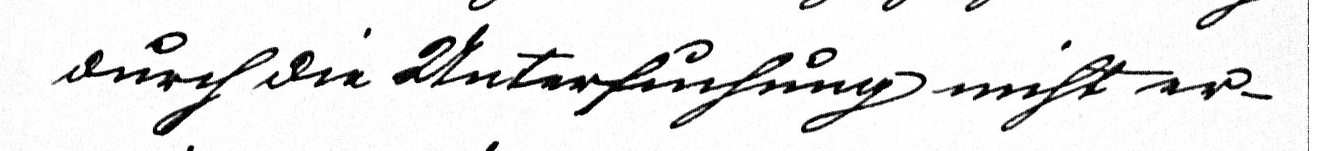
durch die Untersuchung nicht er¬
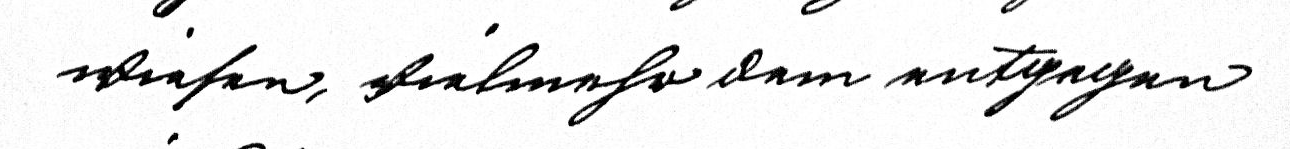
wiesen, vielmehr dem entgegen
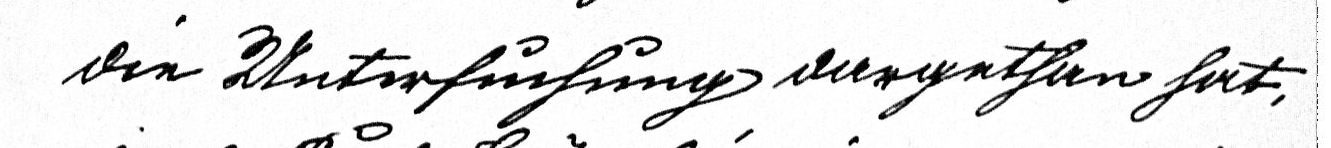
die Untersuchung dargethan hat,
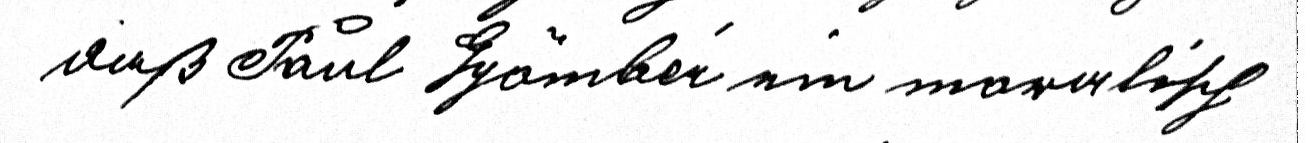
daß Paul Gyömbér ein moralisch
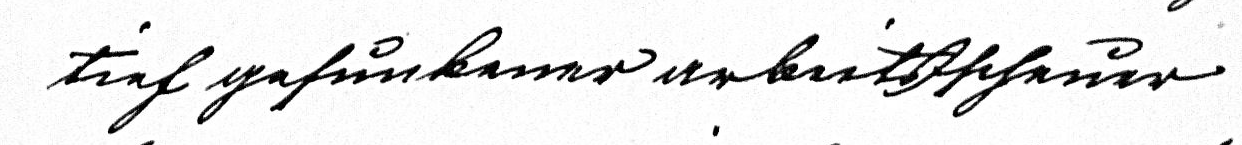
tief gesunkener arbeitsscheuer
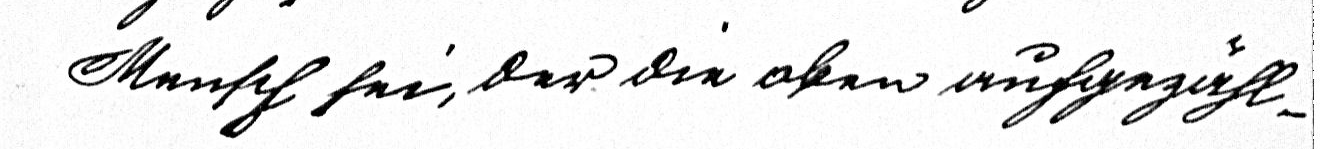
Mensch sei, der die oben aufgezähl¬
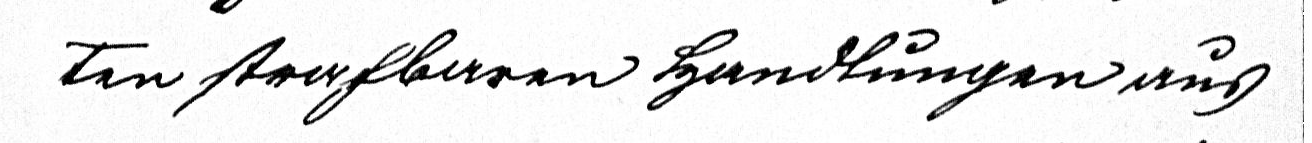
ten strafbaren Handlungen aus
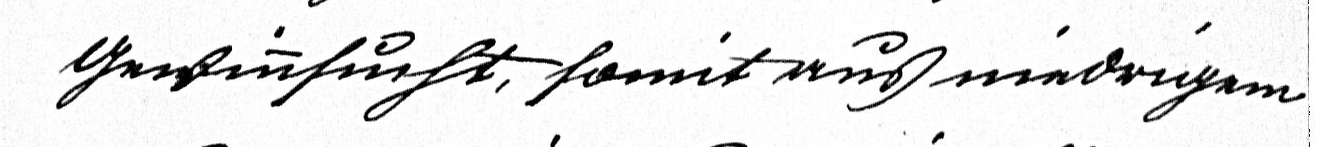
Gewinnsucht, somit aus niedrigem
